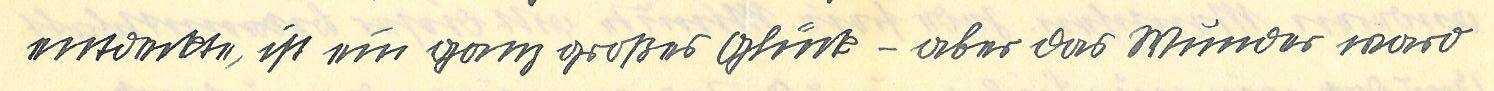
entdeckte, ist ein ganz großes Glück – aber das Wunder ward
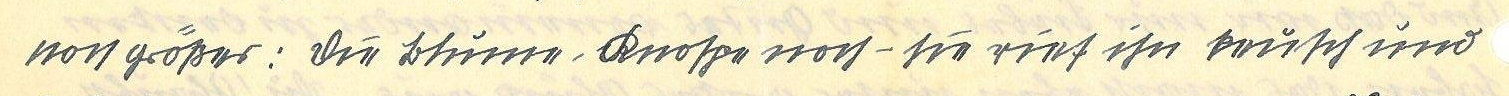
noch größer: Die Blume, Knospe noch – sie rief ihn keusch und
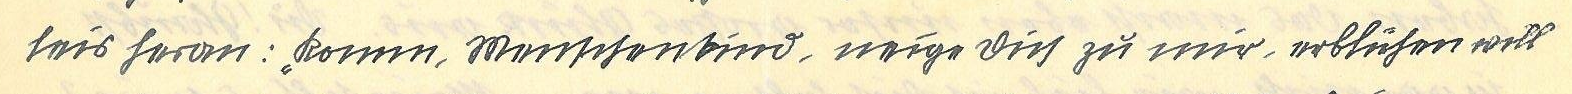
leis heran: “Komm, Menschenkind, neige Dich zu mir, erblühen will
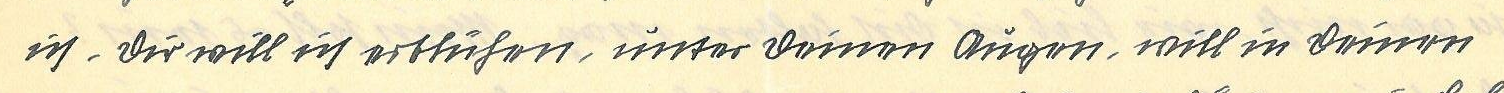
ich, Dir will ich erblühen, unter Deinen Augen, will in Deinen
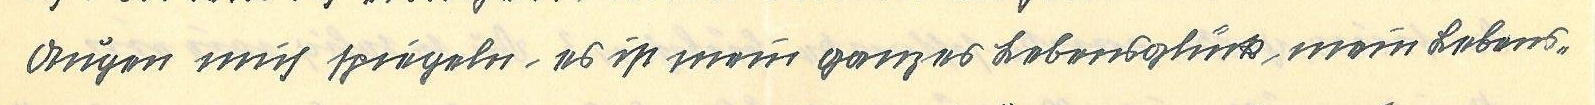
Augen mich spiegeln, es ist mein ganzes Lebensglück, mein Lebens¬
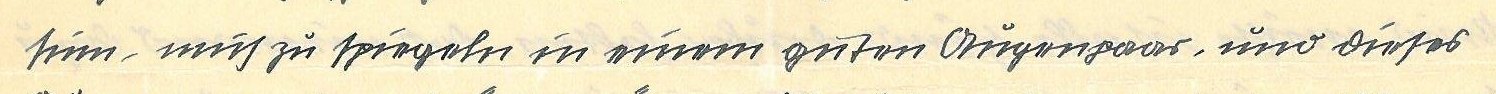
sinn, mich zu spiegeln in einem guten Augenpaar, und dieses
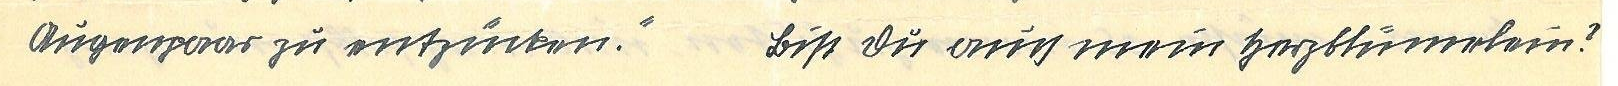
Augenpaar zu entzücken.“Bist Du auch mein Herzblümelein?
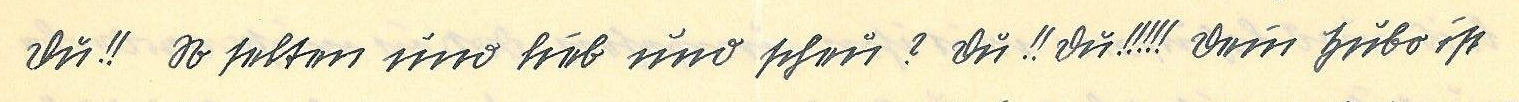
Du!! So selten und lieb und scheu? Du!! Du!!!!! Dein Hubo ist
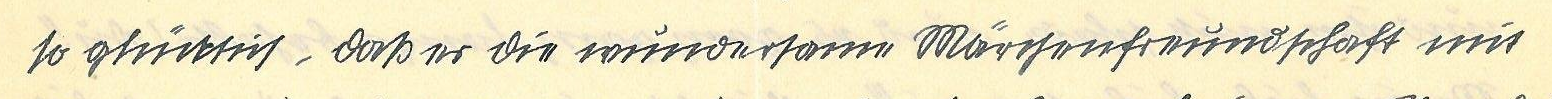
so glücklich, daß er die wundersame Märchenfreundschaft mit
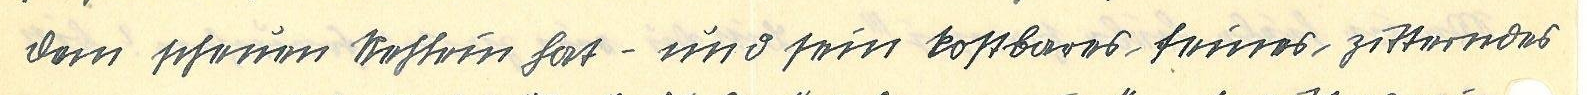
dem scheuen Rehlein hat – und sein kostbares, feines, zitterndes
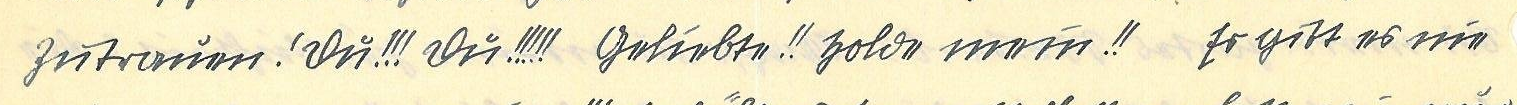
Zutrauen! Du!!! Du!!!!! Geliebte!! Holde mein!! Er gibt es nie
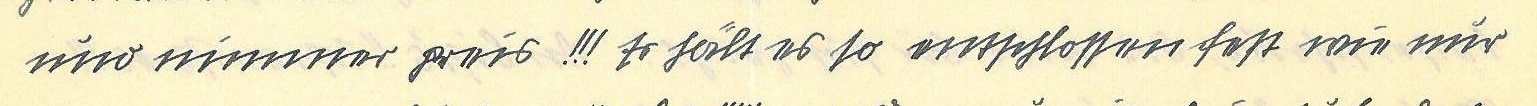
und nimmer preis!!! Er hält es so entschlossen fest wie nur
